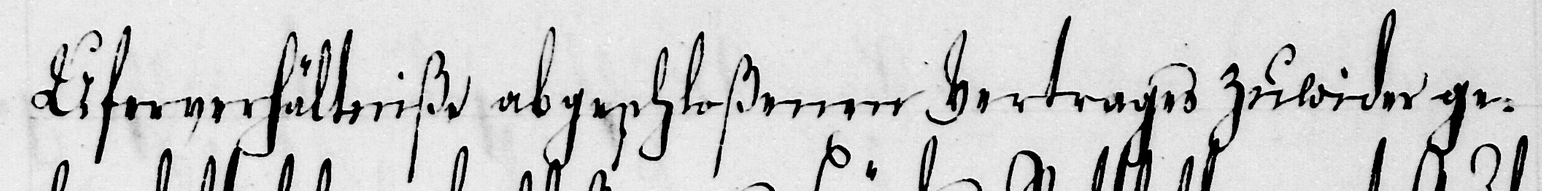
Uferverhältniße abgeschloßenen Vertrages zuwider ge¬
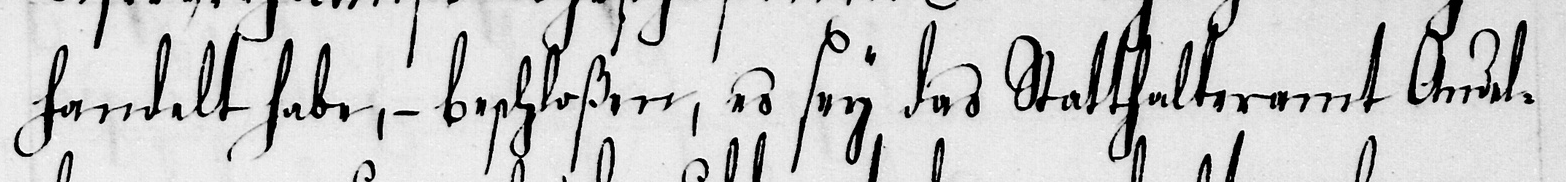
handelt habe, – beschloßen, es sey das Statthalteramt Andel¬
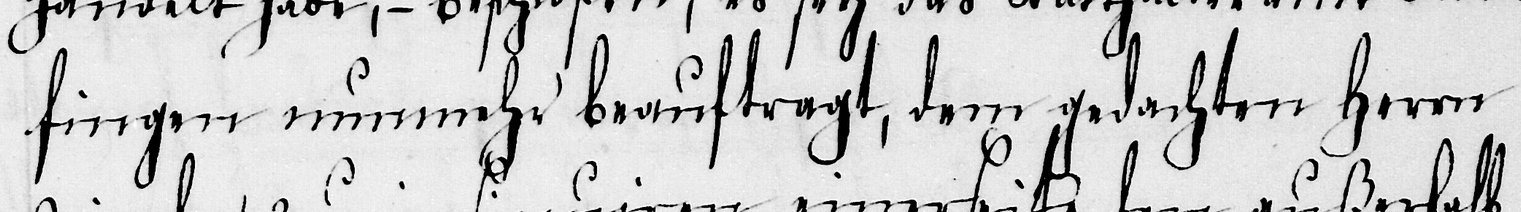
fingen nunmehr beauftragt, dem gedachten Herrn
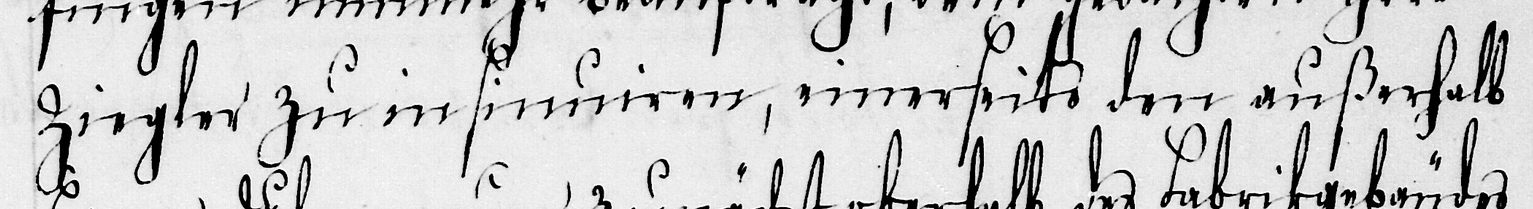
Ziegler zu insinuiren, einerseits den außerhalb
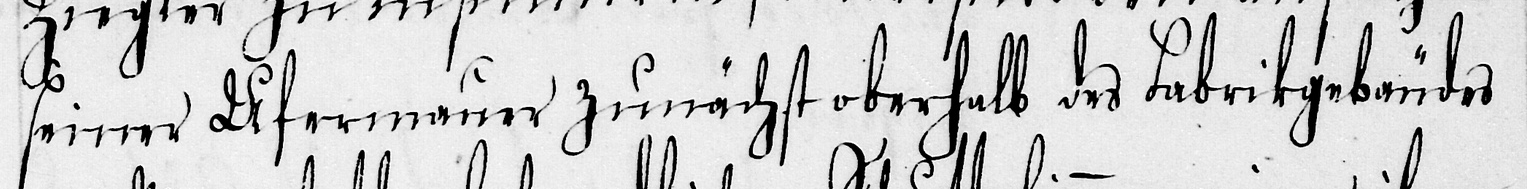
seiner Ufermauer zunächst oberhalb des Fabrikgebäudes
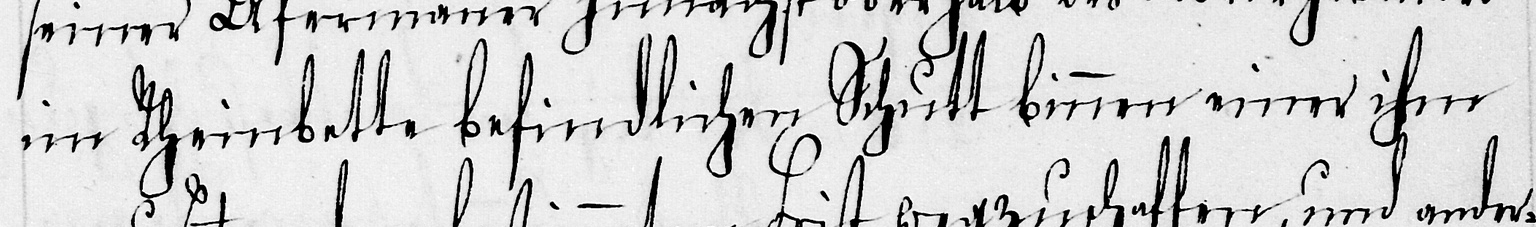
im Rheinbette befindlichen Schutt binnen einer ihm
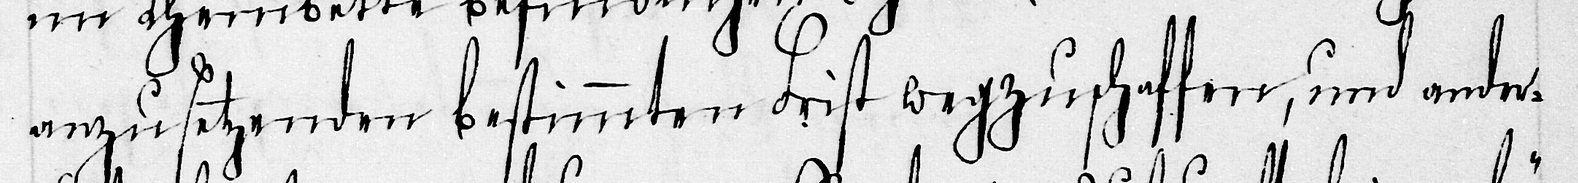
anzusetzenden bestimmten Frist wegzuschaffen, und ander¬
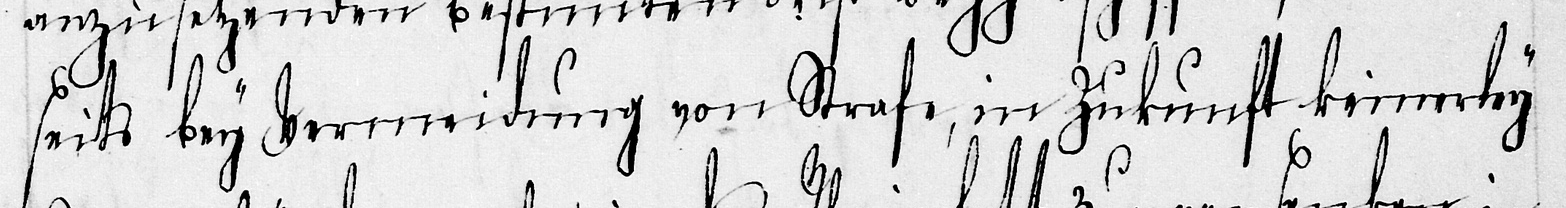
seits bey Vermeidung von Strafe, in Zukunft keinerley
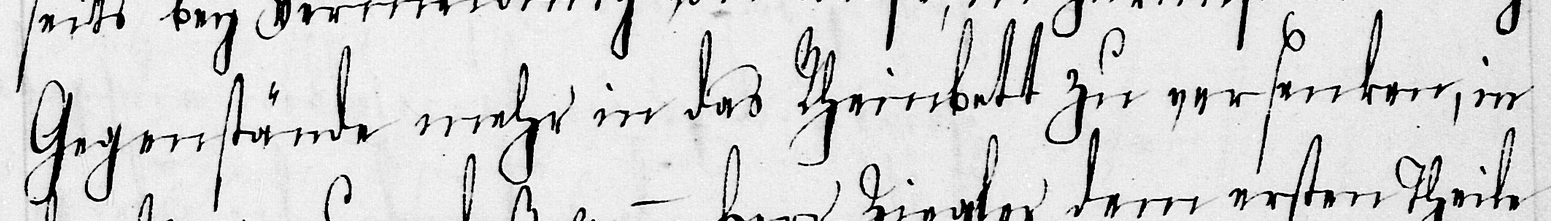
Gegenstände mehr in das Rheinbett zu versenken, in
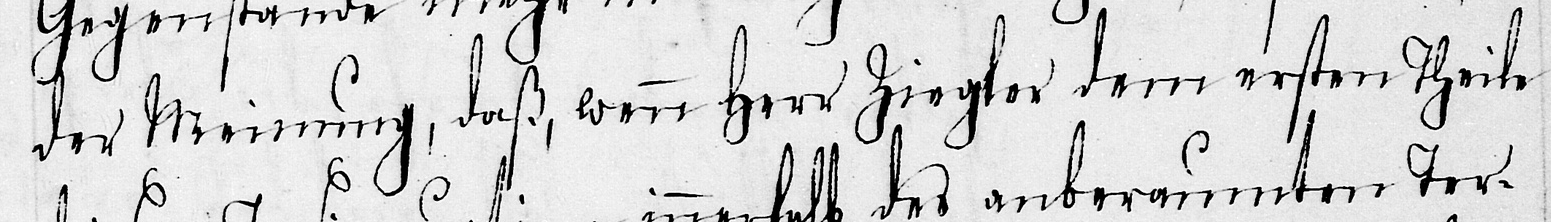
der Meinung, daß, wenn Herr Ziegler dem ersten Theile
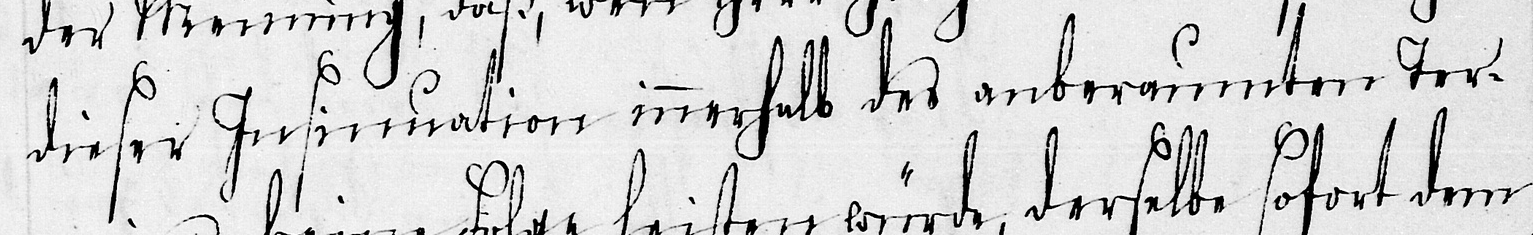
dieser Insinuation innerhalb des anberaumten Ter¬
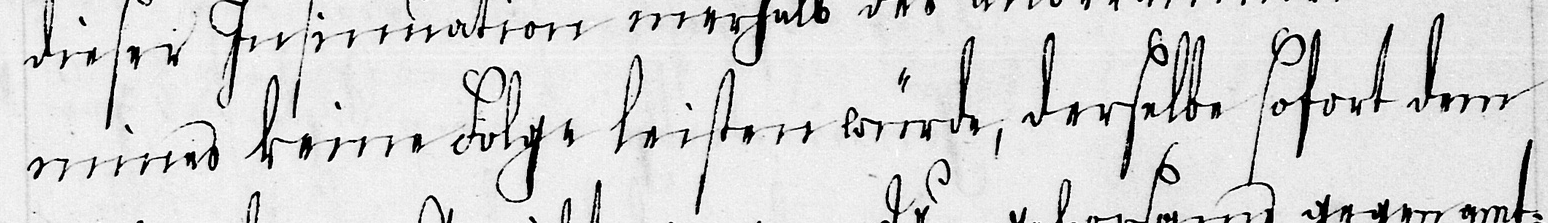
mines keine Folge leisten würde, derselbe sofort dem
